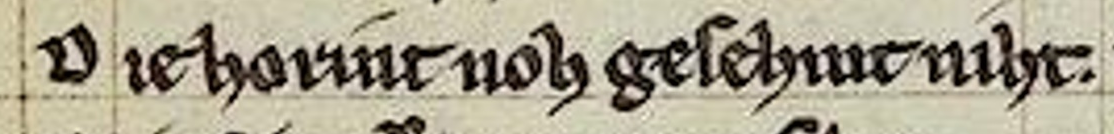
Die horint noh geſehint niht.
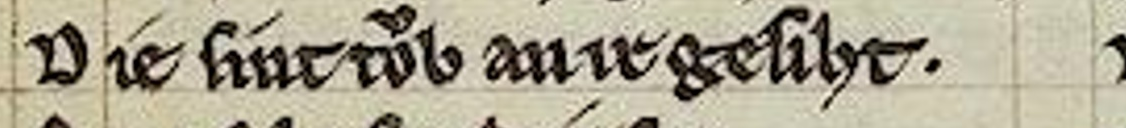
Die ſint to°vb an ir geſiht.
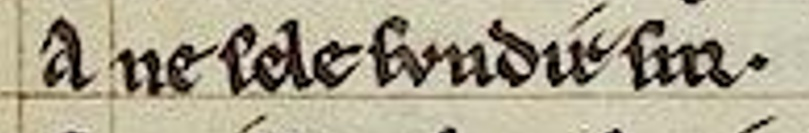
Ane ſele ſvndir ſin.
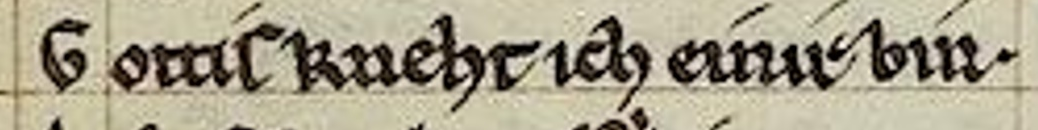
Gottiſ kneht ich einir bin.
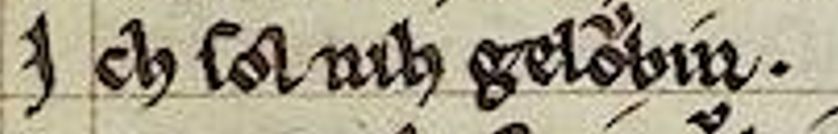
Ich ſol nih gelo°vbin.
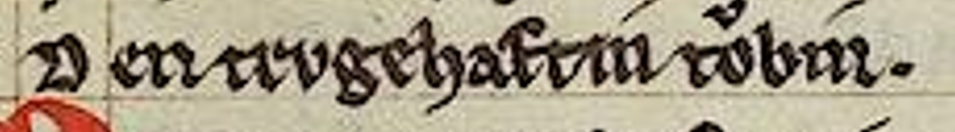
Den trvgehaftin to°vbin.
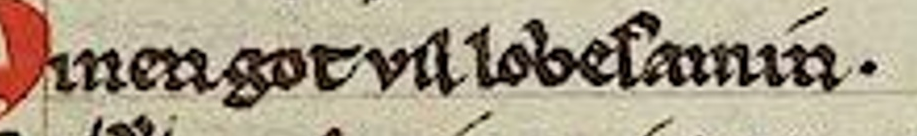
*Dinen got vil lobeſamin.
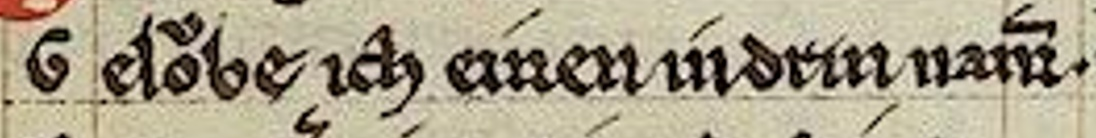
Gelo°vbe ich einen in drin nam(n).
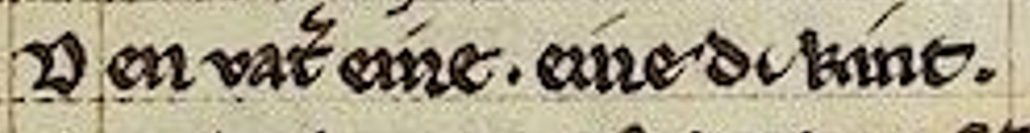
Den vat(er) eine. eine d(az) kint.
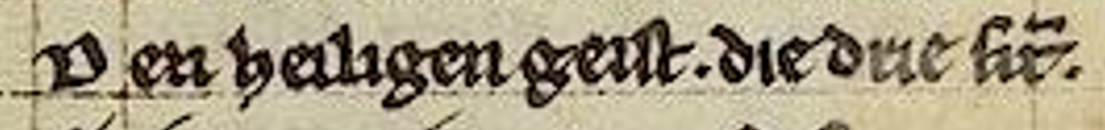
Den heiligen geiſt. die drie ſit(n).
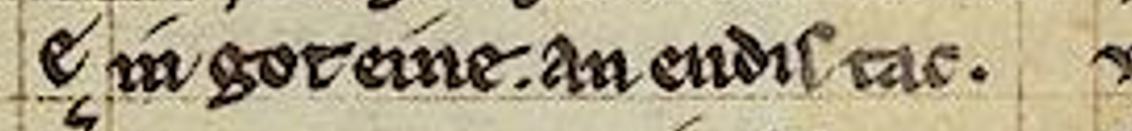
Ein got eine. an endiſ tac.
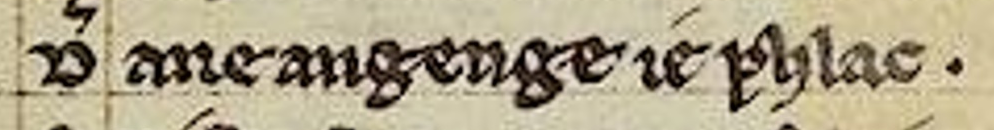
D(er) ane angenge ie phlac.
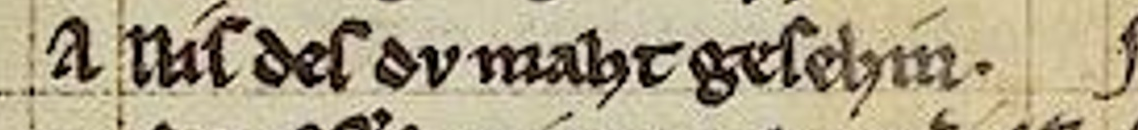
Alliſ deſ dv maht geſehin.
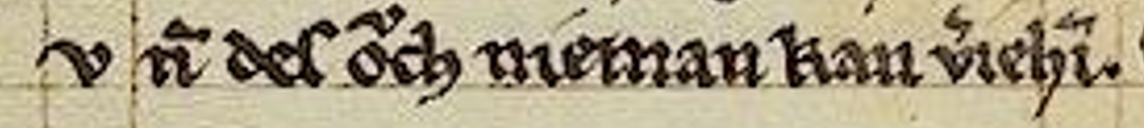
Vn(d) deſ o°vch nieman kan v(er)iehi(n).
